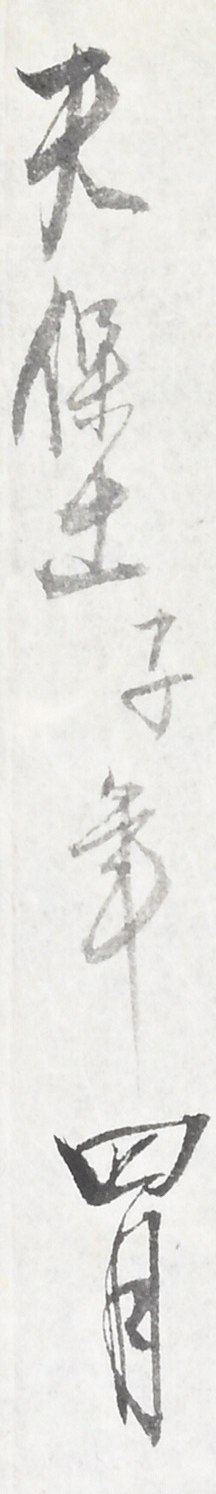天保十一子年四月
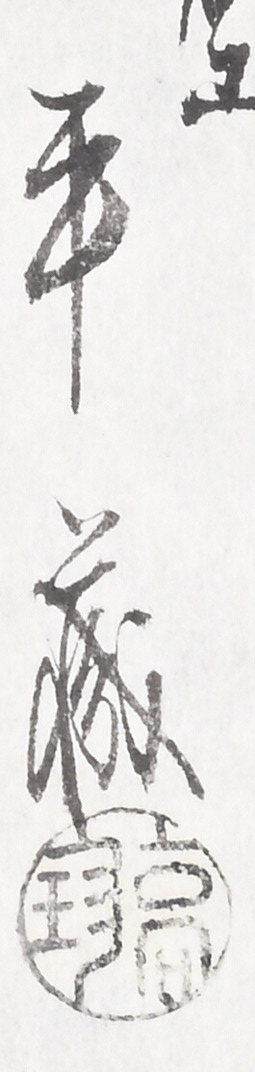平蔵㊞
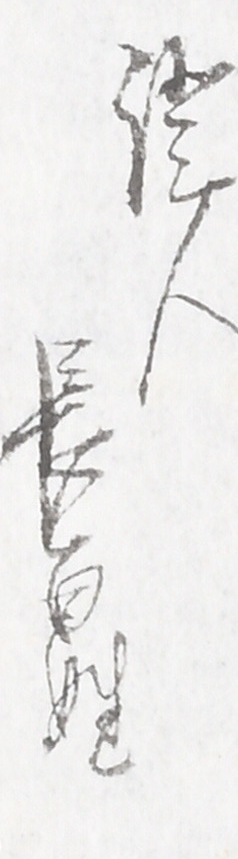長百姓
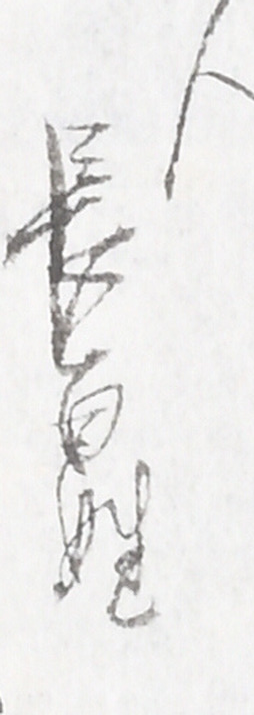長百姓
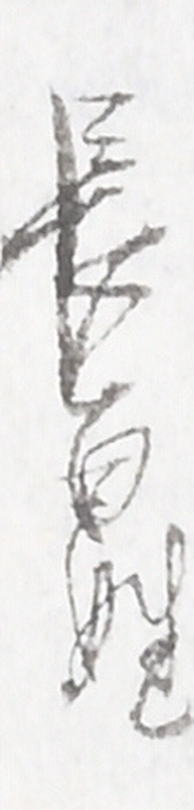長百姓
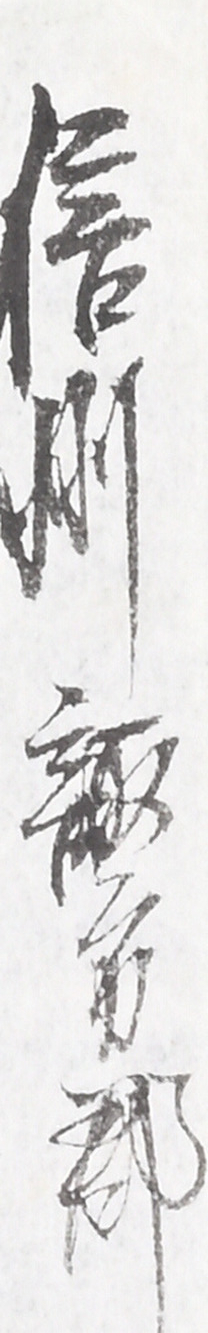信州諏方郡
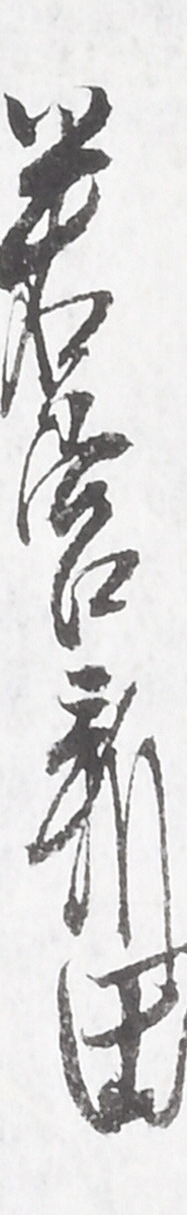若宮新田
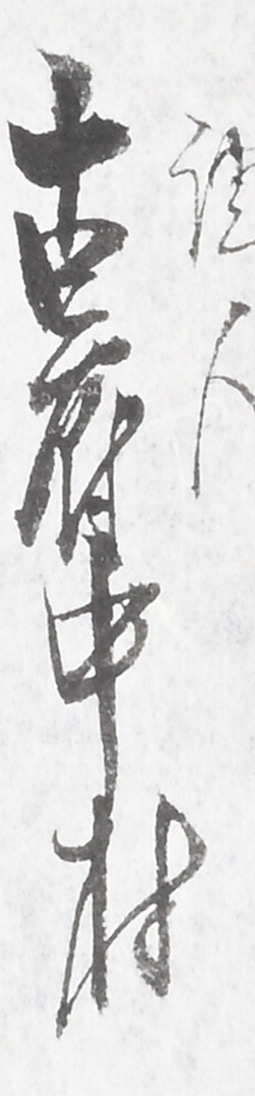古府中村
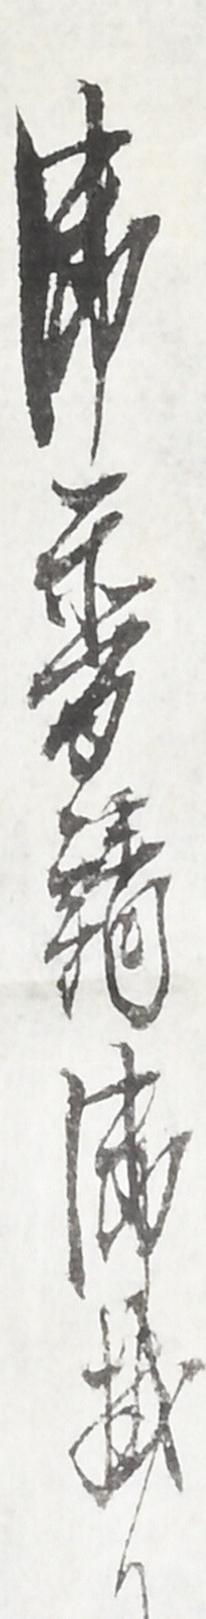御普請御掛り
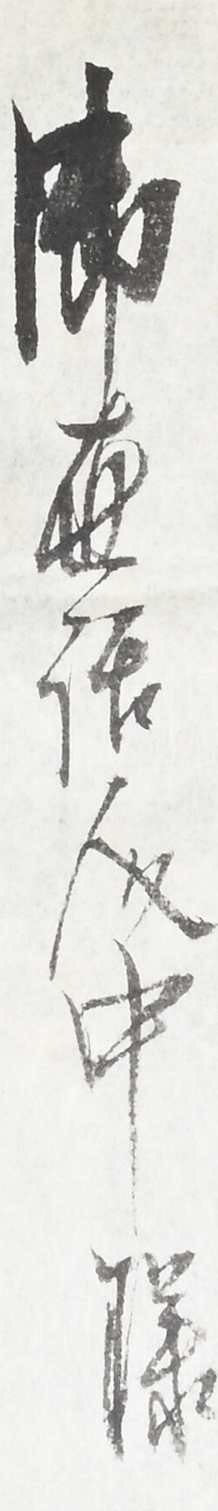御世話人中様
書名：差出申證文之事
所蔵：伊那市立高遠町図書館・合同会社AMANE
